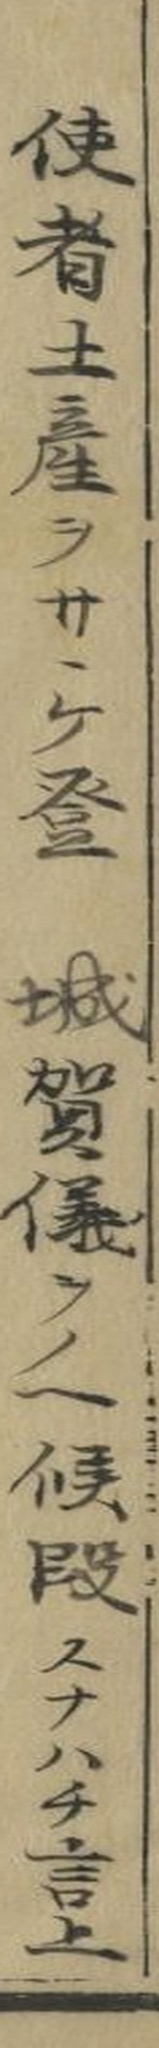使者土産ヲサ〵ケ登城賀儀ヲノヘ候段スナハチ言上
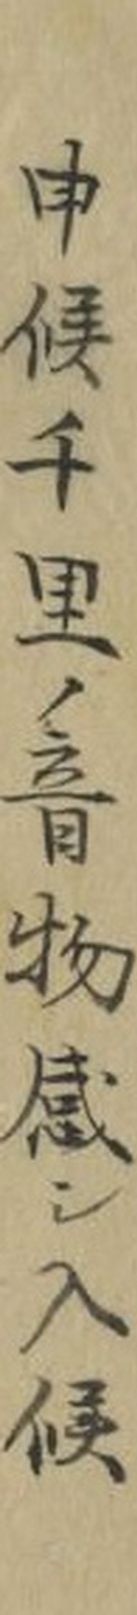申候千里ノ音物感シ入候
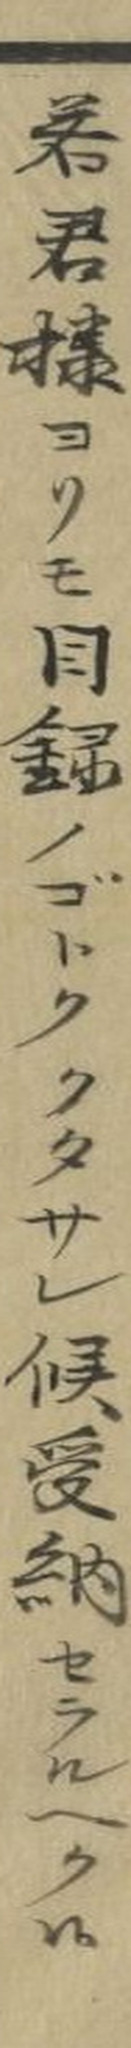若君様ヨリモ目録ノゴトククタサレ候受納セラルヘク候
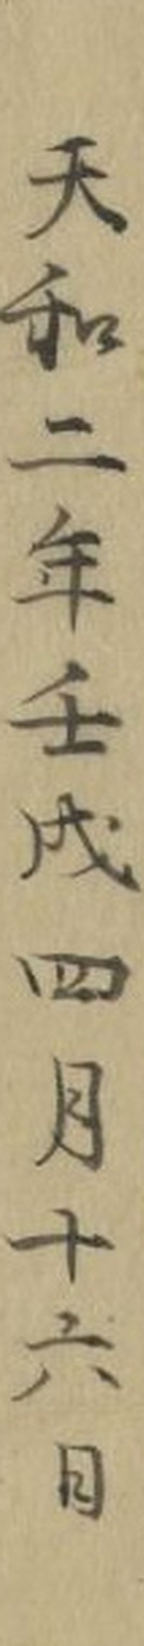天和二年壬戌四月十六日
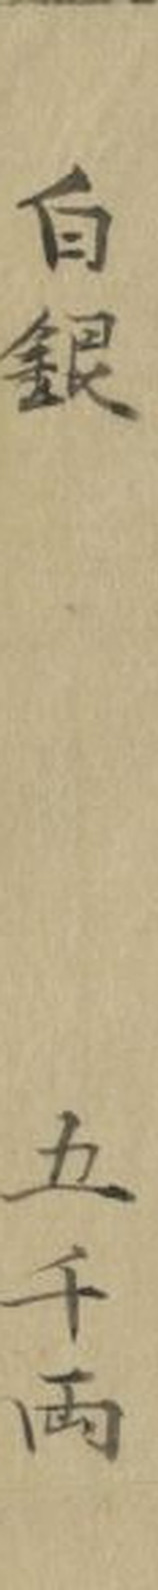白銀五千両
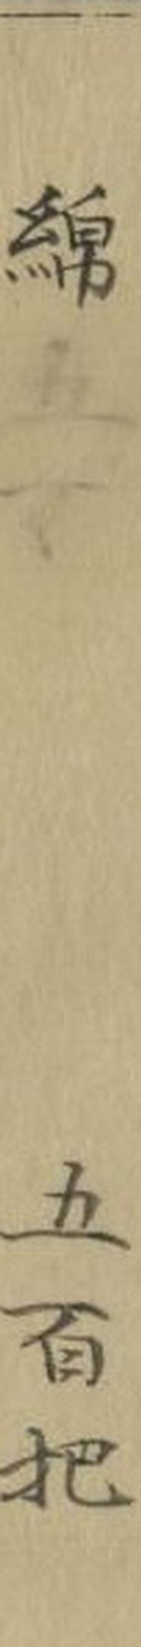綿五百把
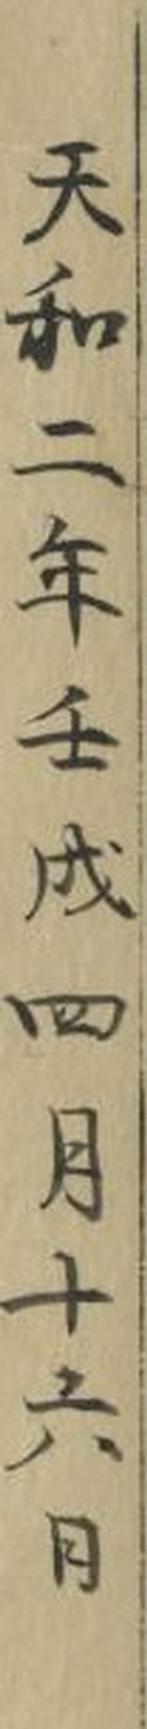天和二年壬戌四月十六日
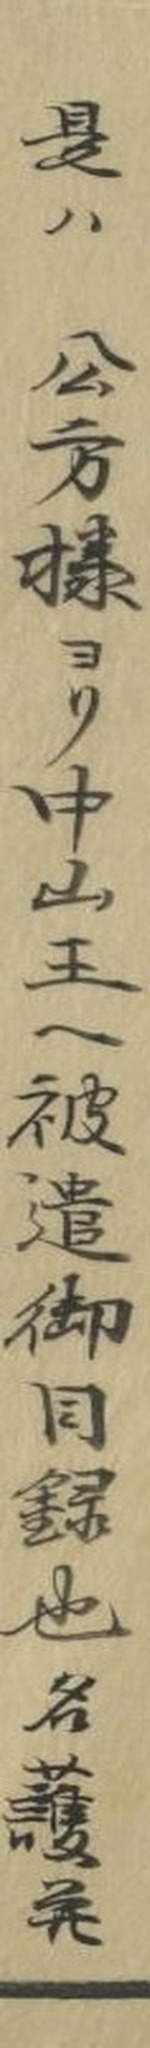是ハ公方様ヨリ中山王へ被遣御目録也名護并
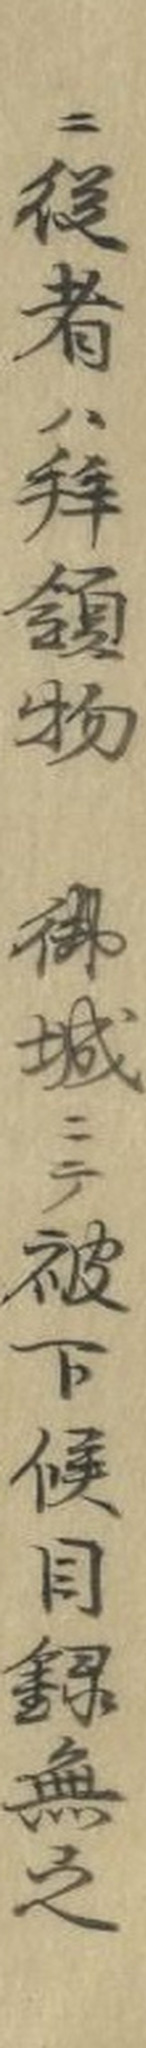ニ使者ハ拝領物御城ニテ被下候目録無之
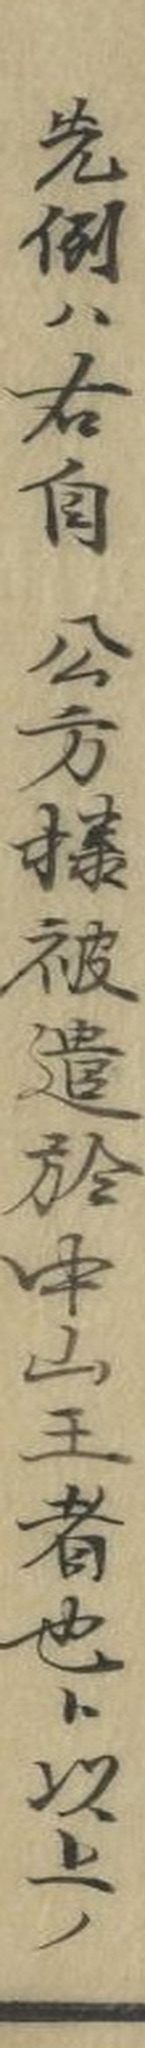先例ハ右自公方様被遣於中山王者也ト以上ノ
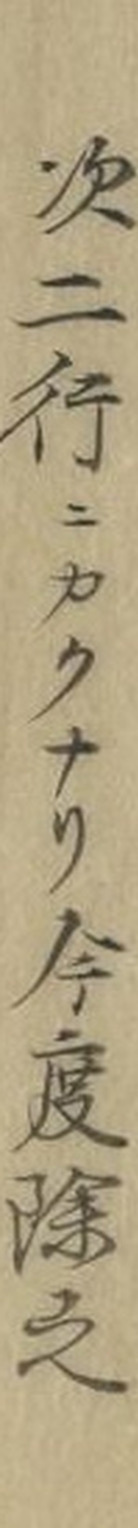次二行ニカクナリ今度除之

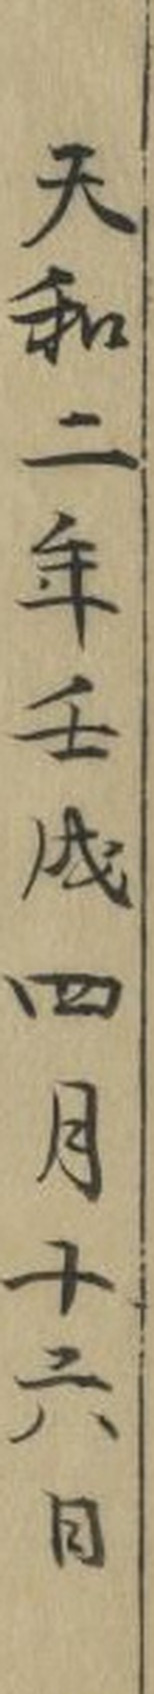天和二年壬戌四月十六日
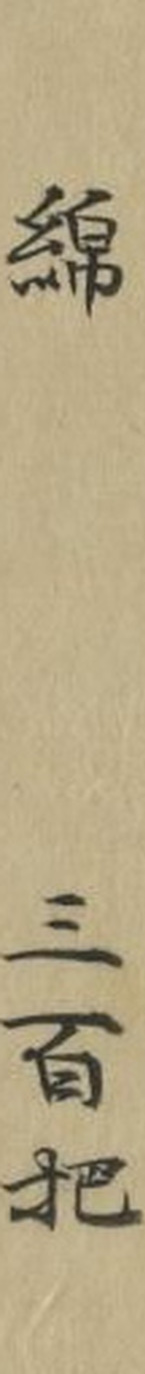綿三百把
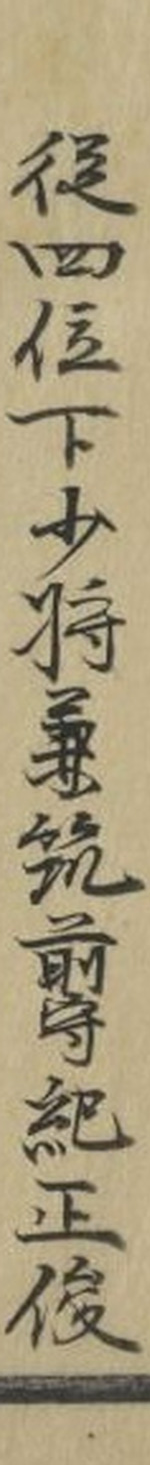従四位下少将兼筑前守紀正俊
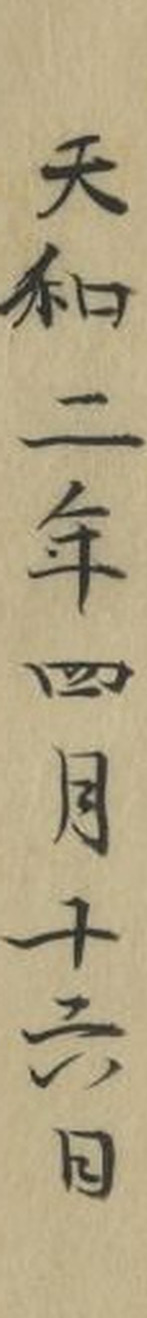天和二年四月十六日
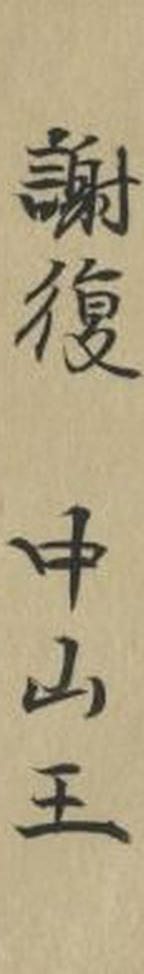謝復中山王
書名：琉球往来（下）
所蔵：University of the Ryukyus Library
